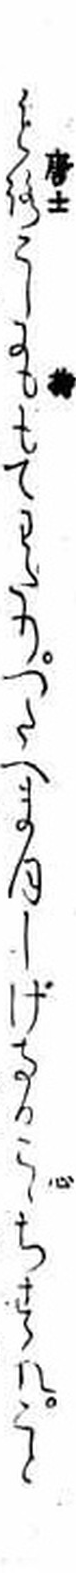もろこしにももてわたり。つたへまほしげなるこゝちすれ。こと
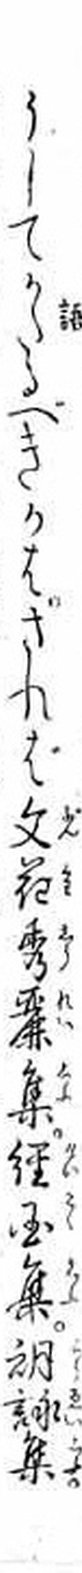うしてかたるべきかは。されば文花秀麗集。経国集。朗詠集。
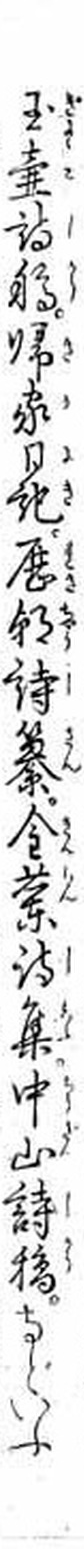玉壺詩稿。帰家日記。歴朝詩纂。金蘭詩集。中山詩稿。などいふ
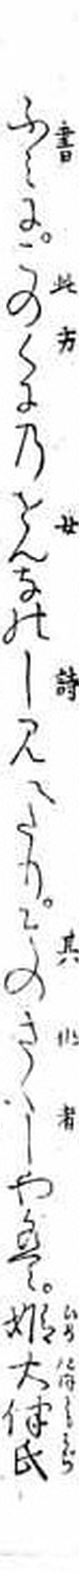ふみに。このくにのをんなのし見へたり。そのさくしゃは。姫大伴氏
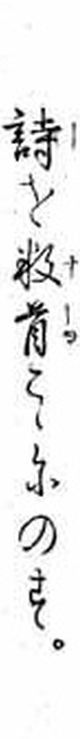詩を数首こゝにのす。

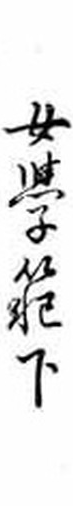女学範下
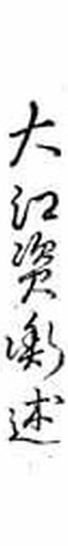大江資衡述
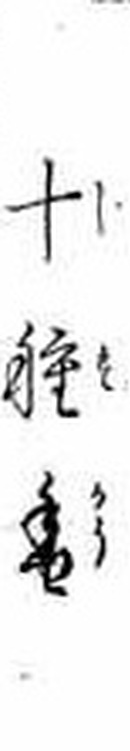十種香
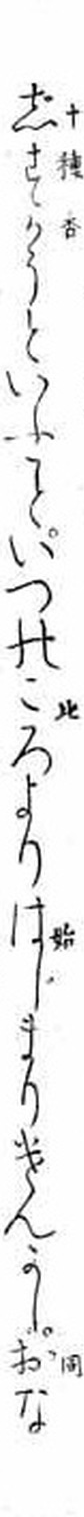じすかうといふこと。いつのころよりはじまりけんかし。おな
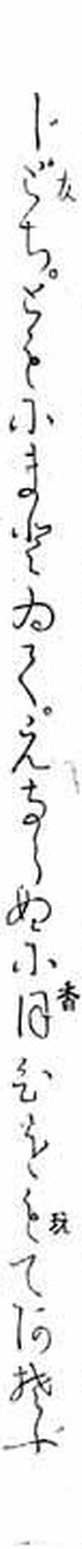じどち。ともにまとゐて。えならぬにほひをもてあそぶ
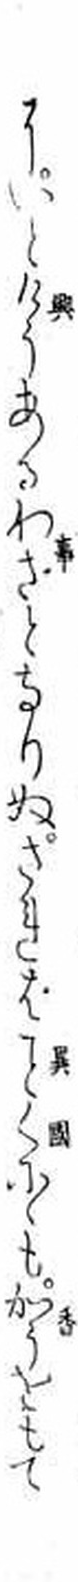に。いとけうあるわざとなりぬ。さればことくにゝも。かうをもて
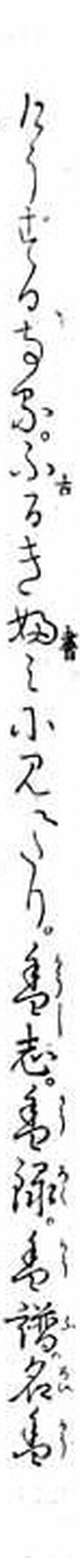けうずるなる。ふるきふみに見えたり。香志。香録。香譜。名香
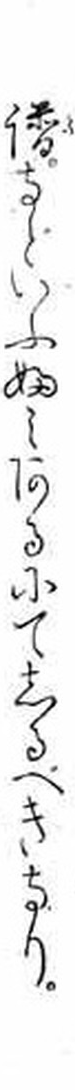譜。などいふふみあるにてしるべきなり。
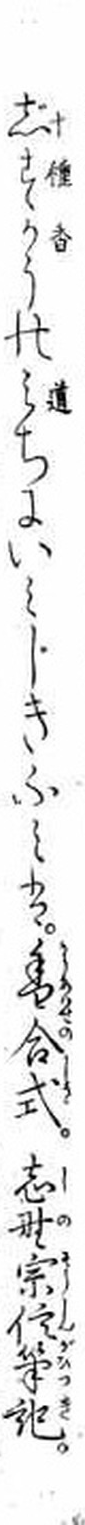じすかうのみちにいみじきふみは。香合式。志野宗信筆記。
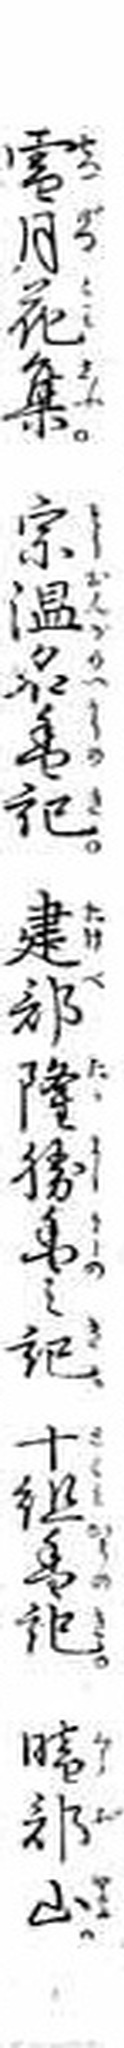雪月花集。宗温名香記。建部隆勝香之記。十組香記。暗部山。
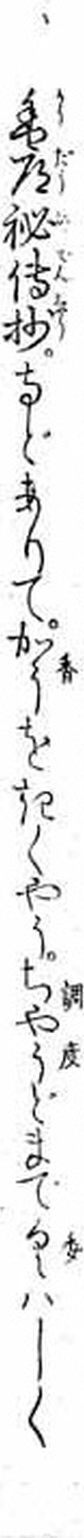香道秘伝抄。などありて。かうをきくやう。ちやうどまでくはしく
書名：女学範
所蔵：東京学芸大学教育コンテンツアーカイブ
